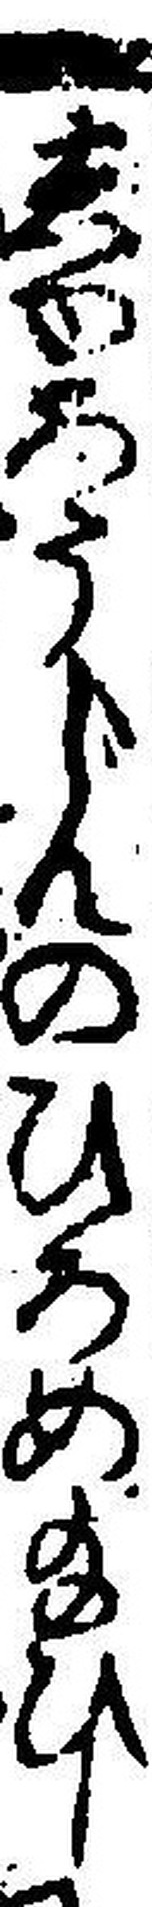しゆろうじんのひろめ給ひし
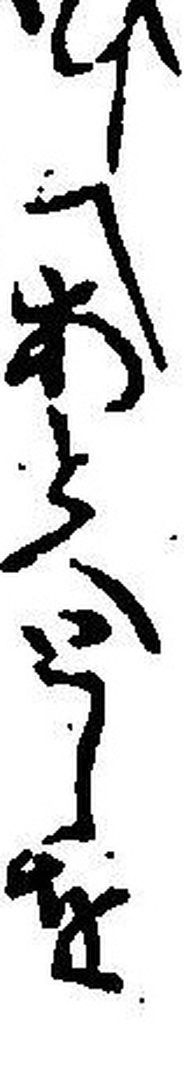〽あとへとしを
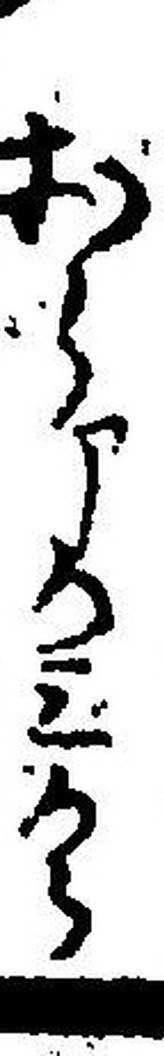おらァかみから
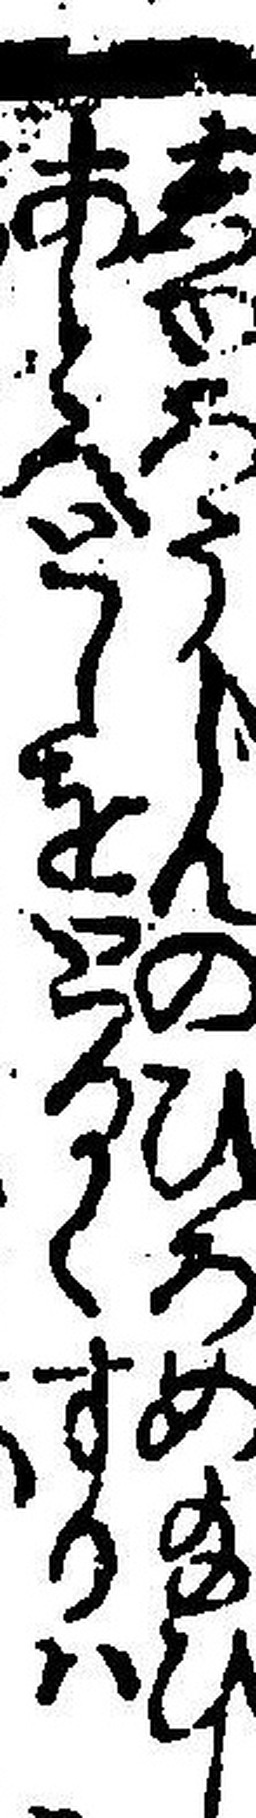あとへとしをとるくすりは
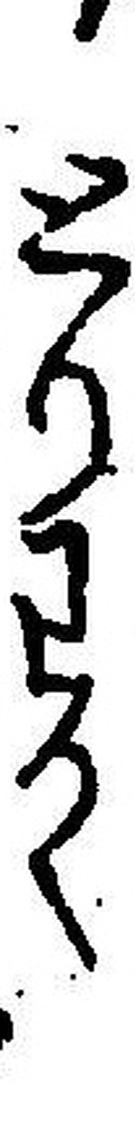とりわかく
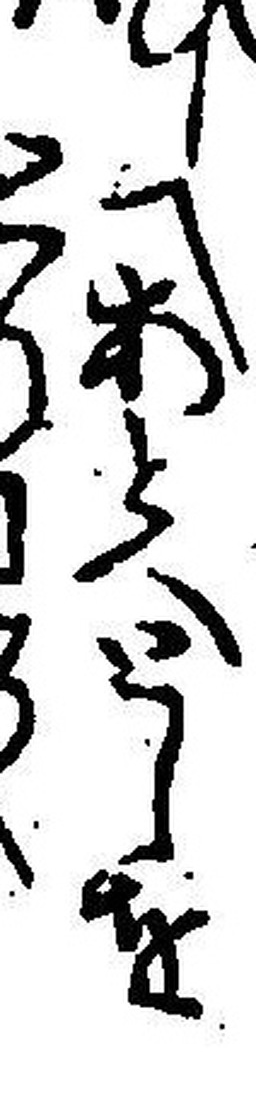とりわかく
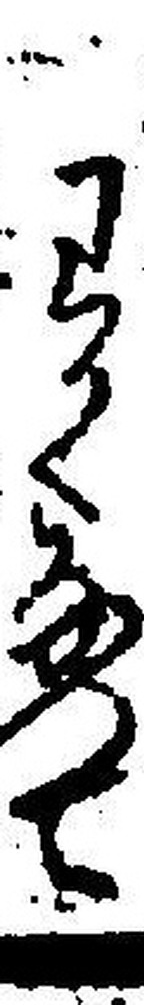わかくなつて
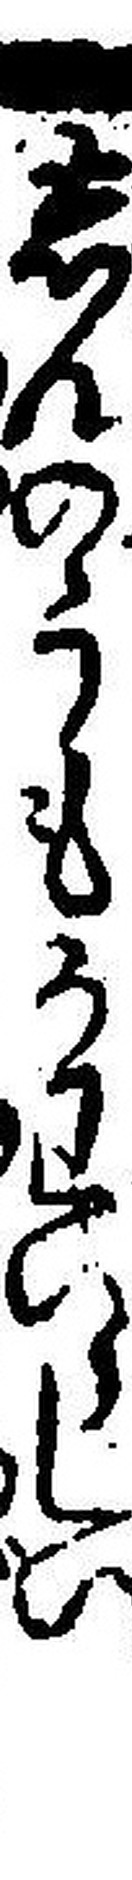しんのうもかわいらしい
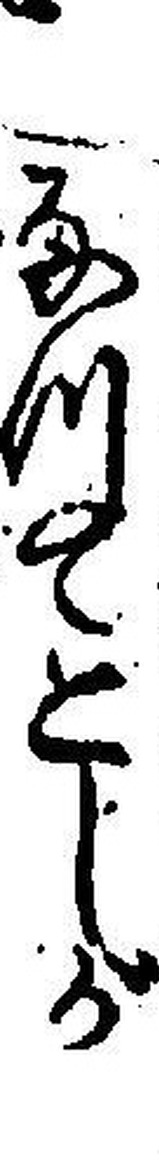なつてとしが
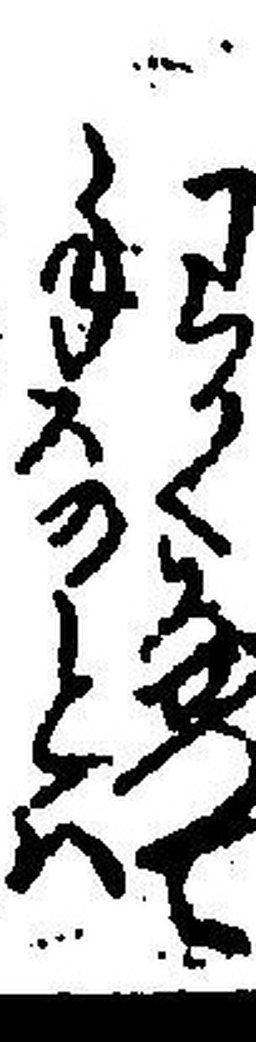手なとは
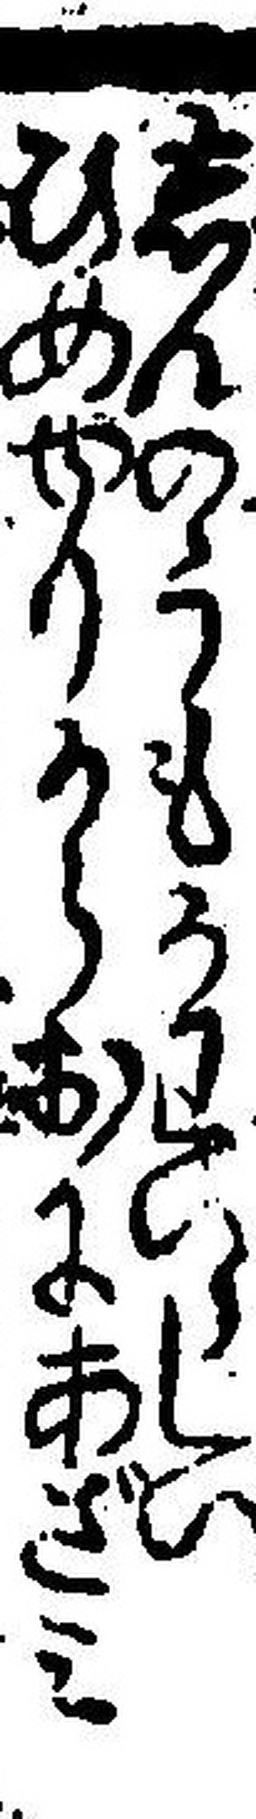ひめゆりからおにあざみ
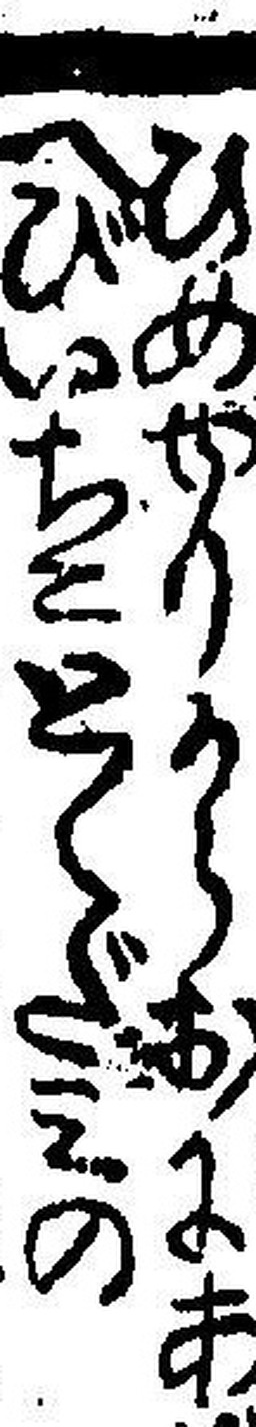へびいちことくだみの
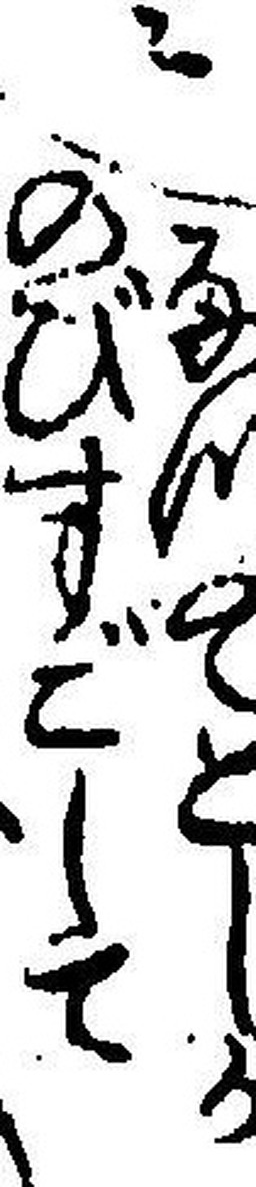のびすごして
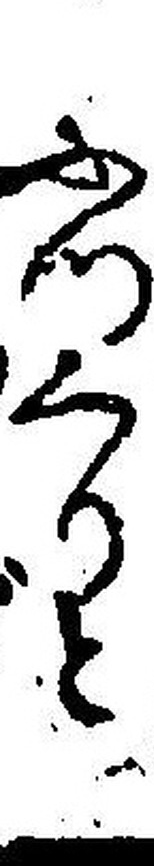ふつくりと
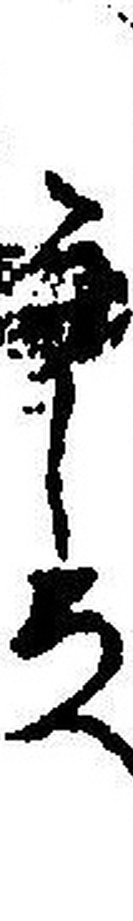うしろへ
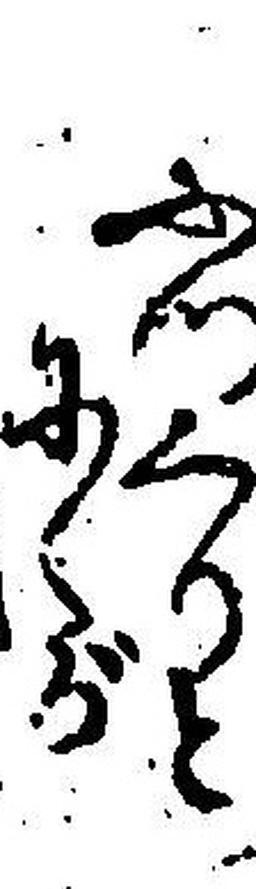にくが
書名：徳若水縁起金性 / 樹下石上作
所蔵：東京大学総合図書館 General Library in the University of Tokyo, JAPAN
